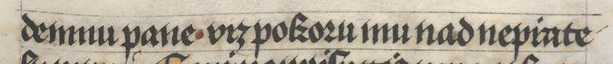demnu pane.viz pokoru mu nad nepṙate¬
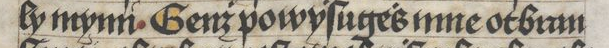ly mym.Genż powyẛugeṡ mne otbran
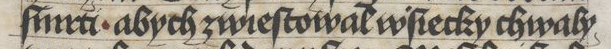ſmrti.abych zwieſtowal wẛiecky chwaly
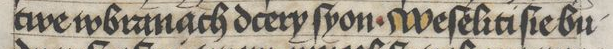twe wbranach dcery ſyon.Weſeliti ſie bu¬
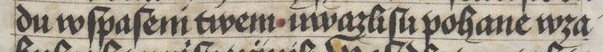du w ſpaſeni twem.uwazliſu pohane wza¬
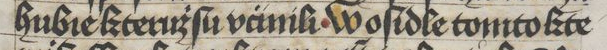hubie kterużſu uċinili.W oſidle tomto kte¬
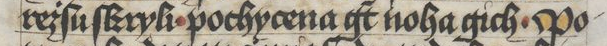reżſu ſkryli.pochycena ḡt noha gich.Po¬
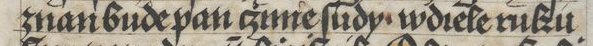znan bude pan cžinie ſudy.wdiele rukú
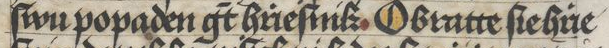ſwu popaden ḡt hṙieẛnik.Obratte ſie hṙie¬
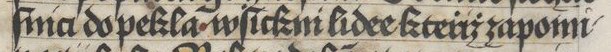ſnici do pekla.wẛickni lidee kteṙiż zapomi-
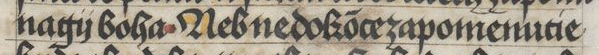nagij boha.Neb nedokōce zapomenutíe
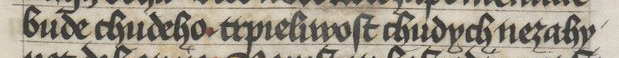bude chudeho.trpieliwoſt chudych nezahy¬
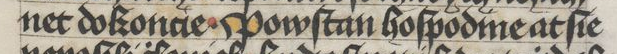net dokoncie.Powſtan hoſpodine at ſie
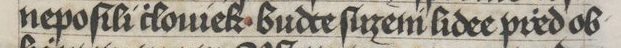nepoſili ċloviek.budte ſuzeni lidee pṙed ob¬
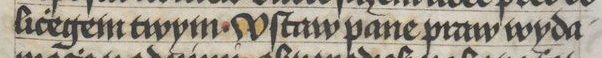ličegem twym.Wſtaw pane praw wyda¬
